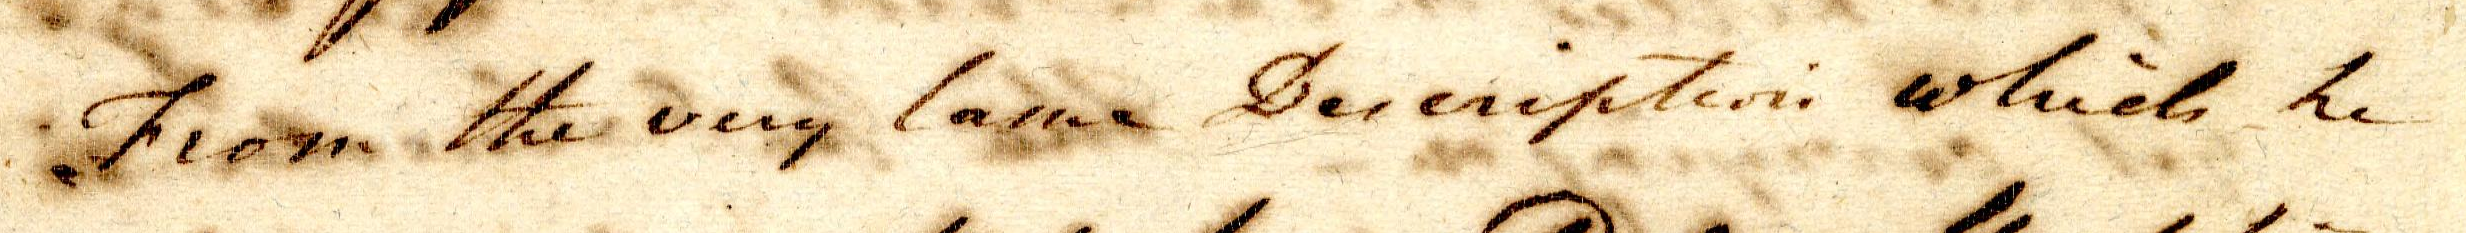From the very lame Description which he
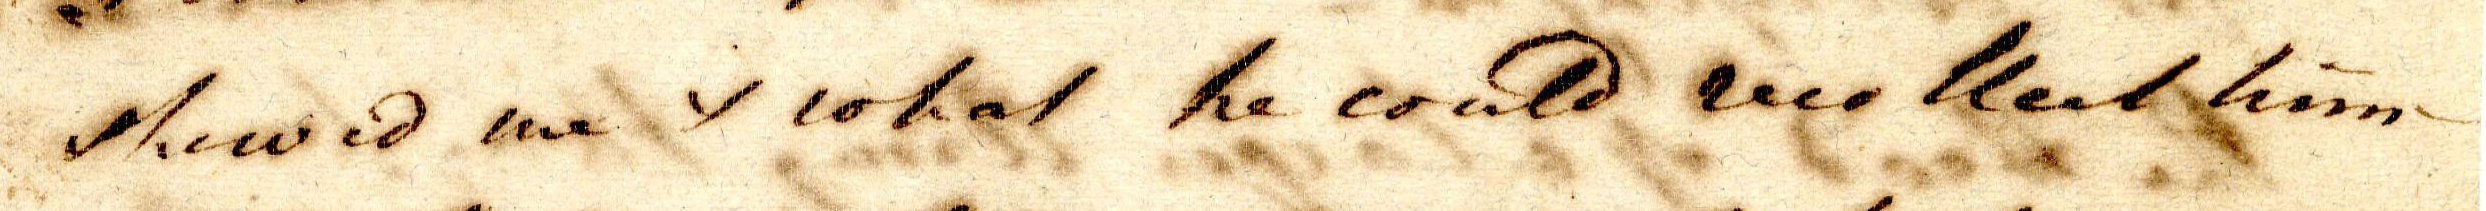shewed me & what he could recollect him-
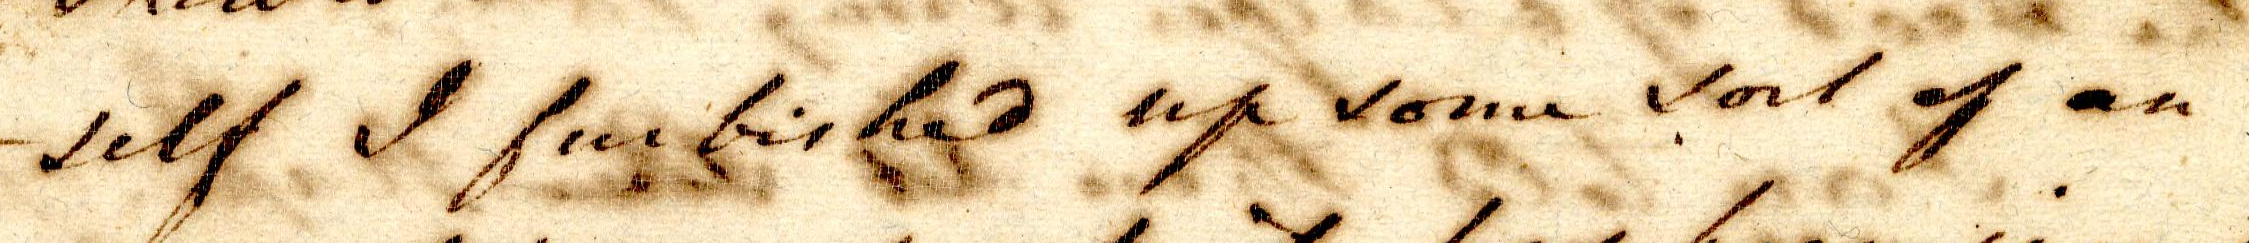-self I furbished up some sort of an
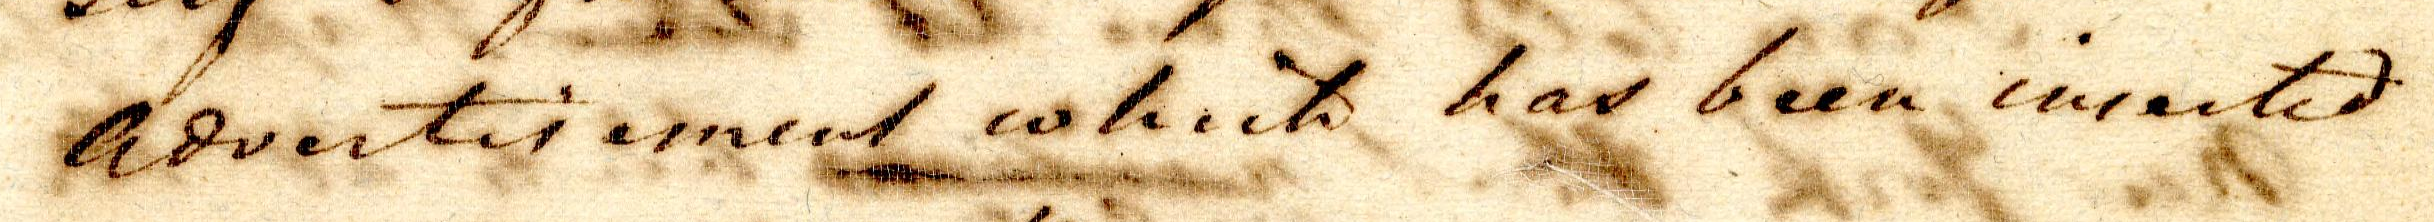advertisement which has been invested
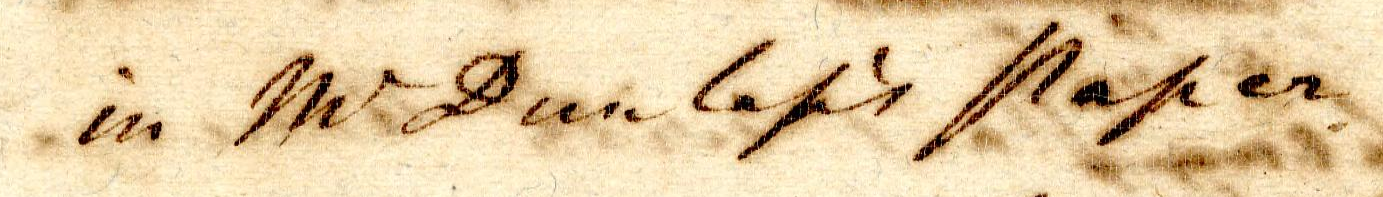in M^r Dunlap's paper.
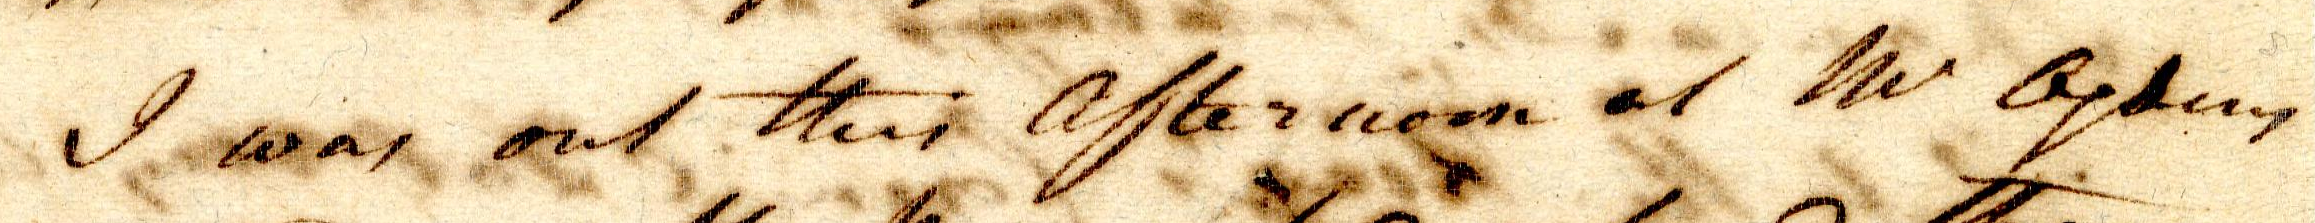I was out this Afternoon at M^r Ogdens
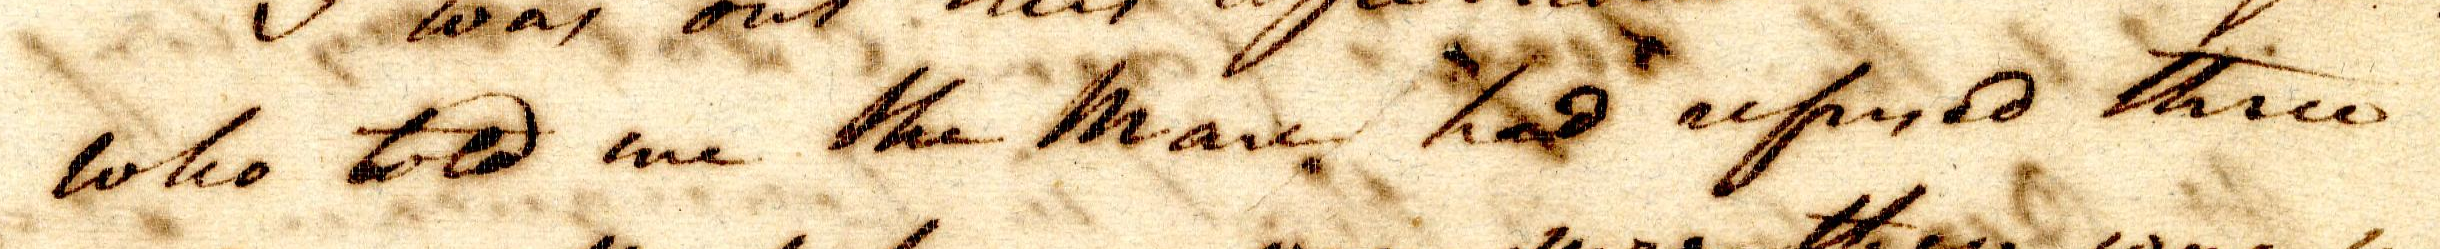who told me the Mare had reposed three
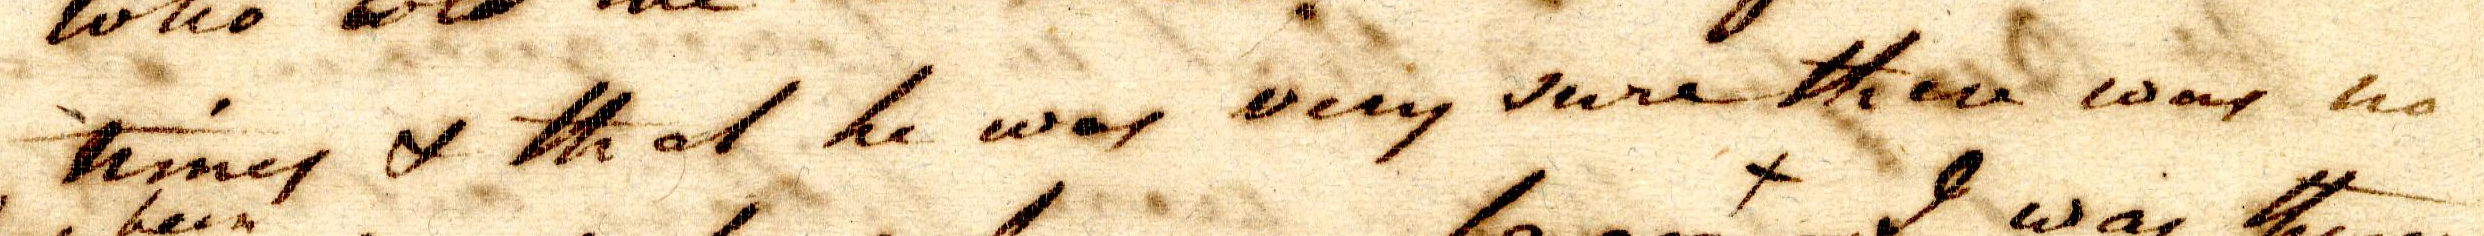times & that he was very sure there was no
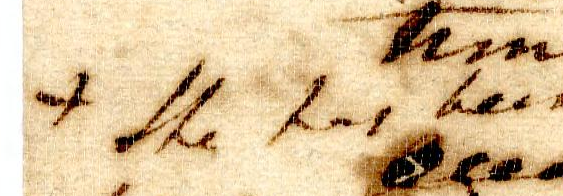& she has been
